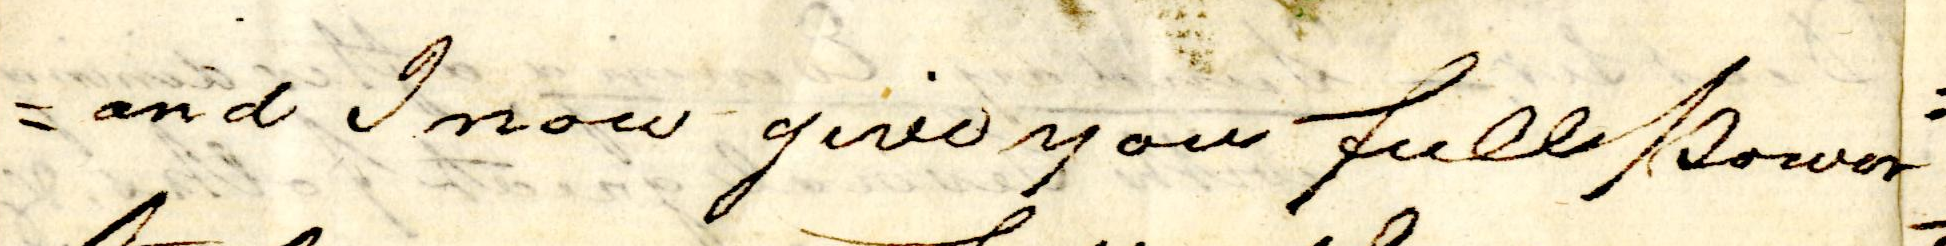and I now give you full power
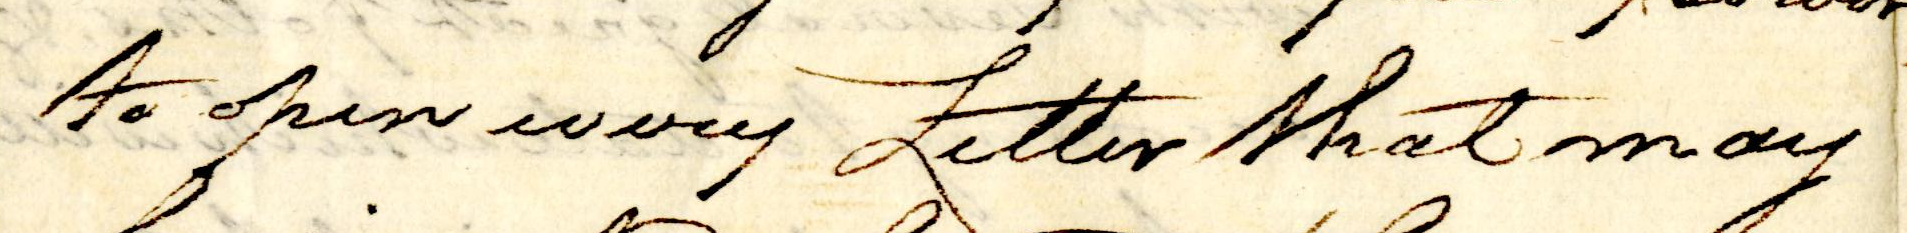to open ever Letter that may
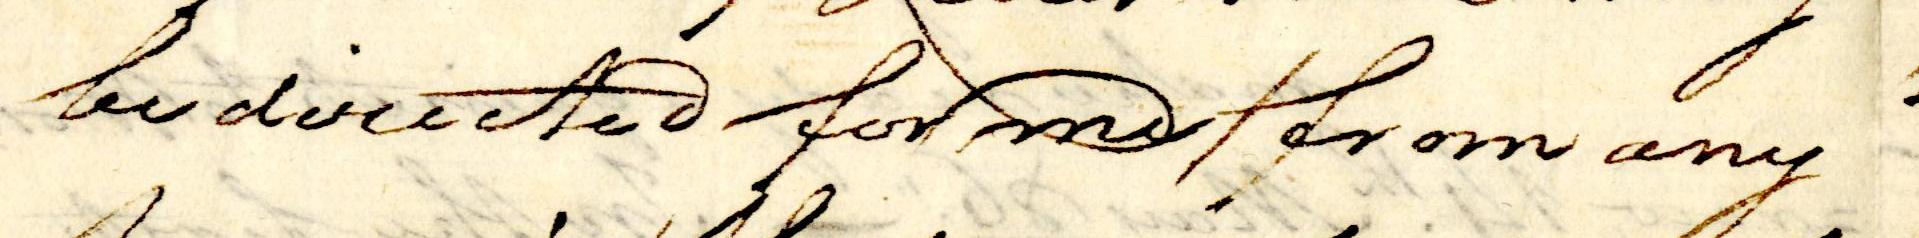be directed for me /from any
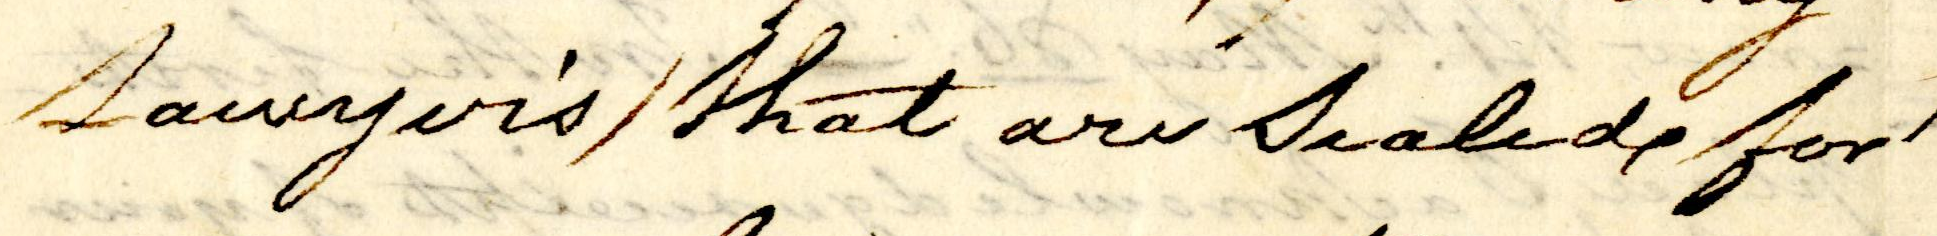Lawyer's/ that are sealed for
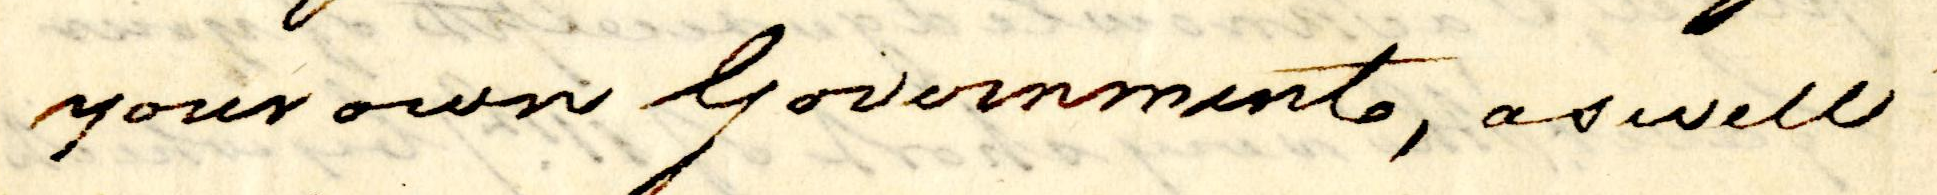your own Government, as well
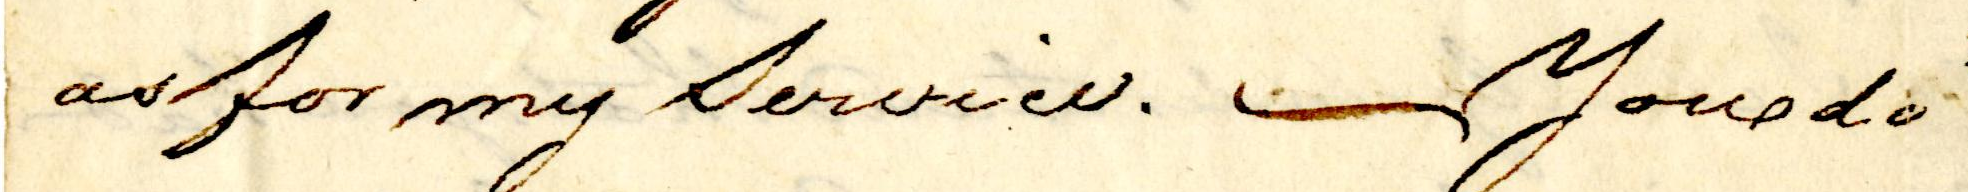as for my Service.- You do
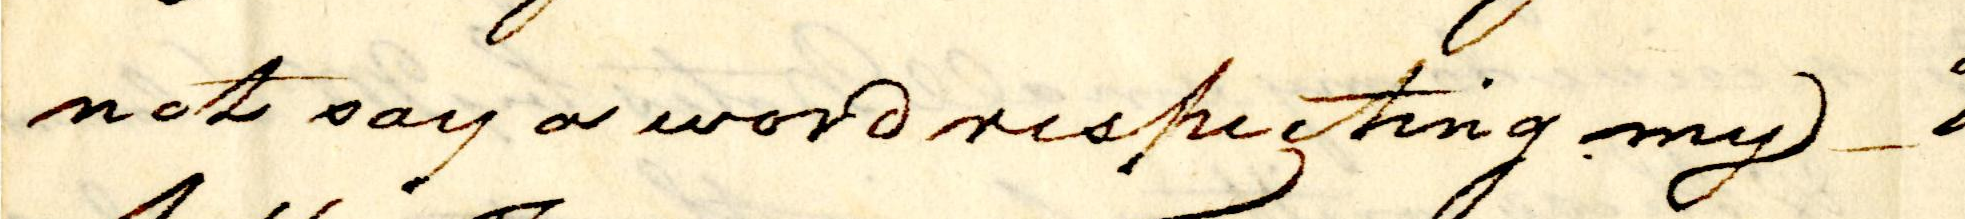not say a word respecting my
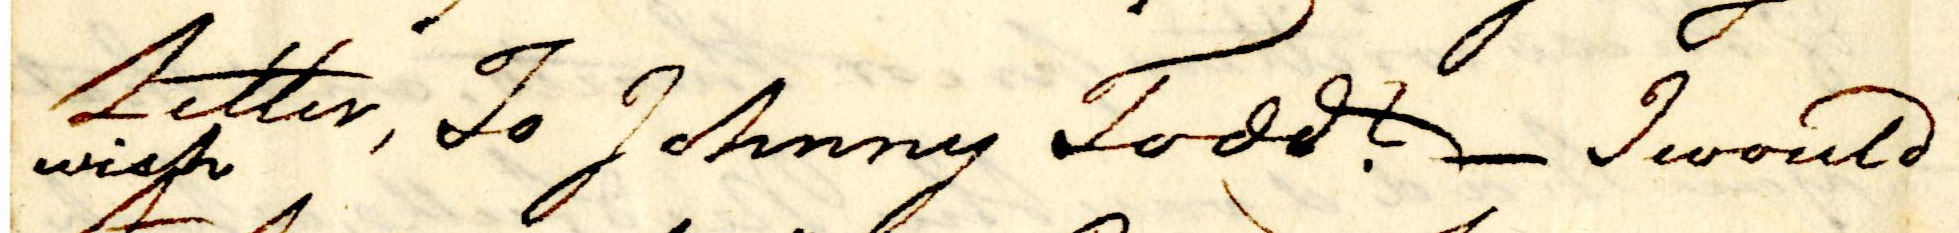Letter, to Johnny Todd?- I would
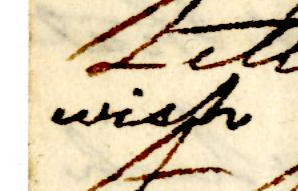wish
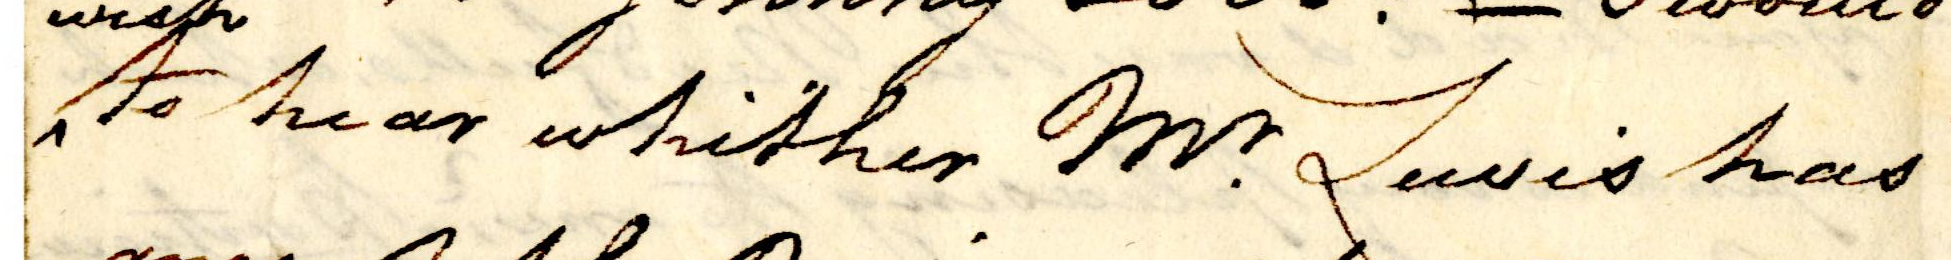^ to hear whither M^r. Lewis had
